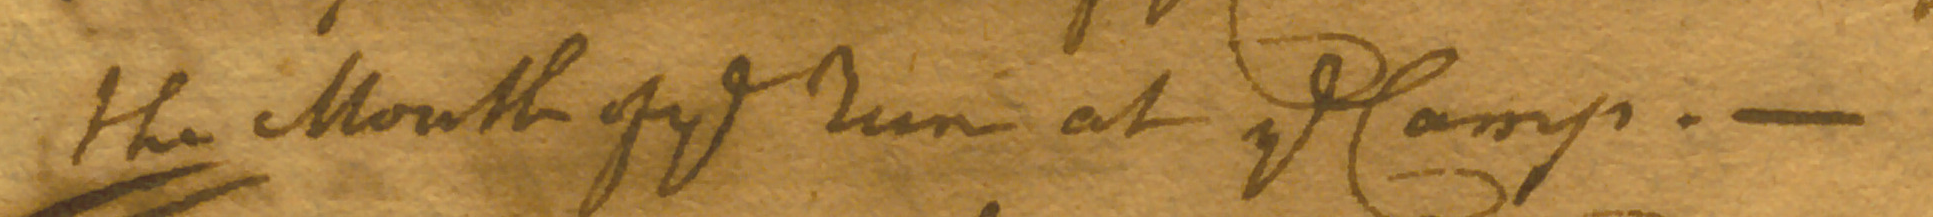the Mouth of y^e run at y^e Camps.-
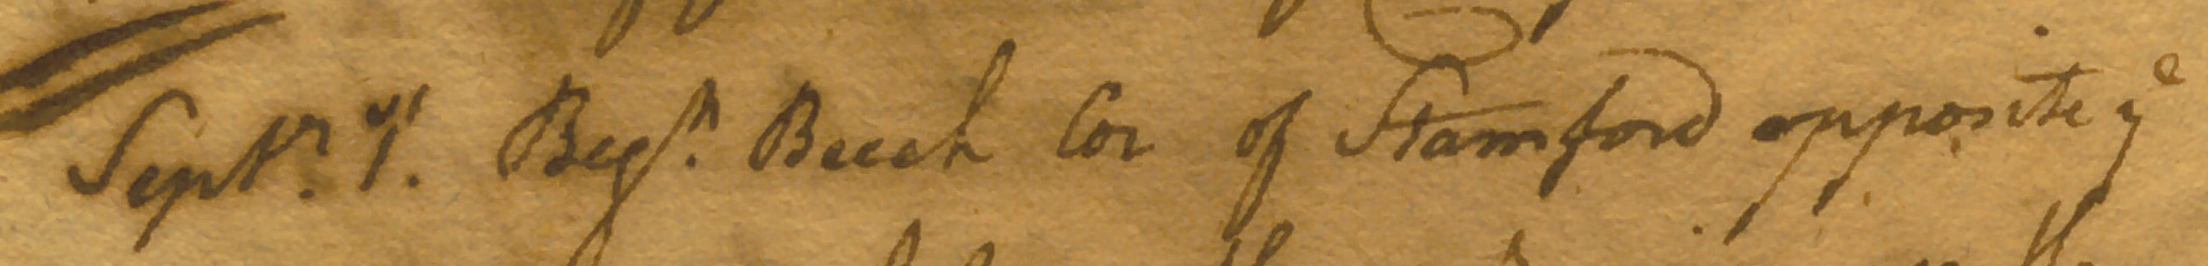Sept^r. 1^st. Beg^n. Beech Cor of Stamford opposite y^e
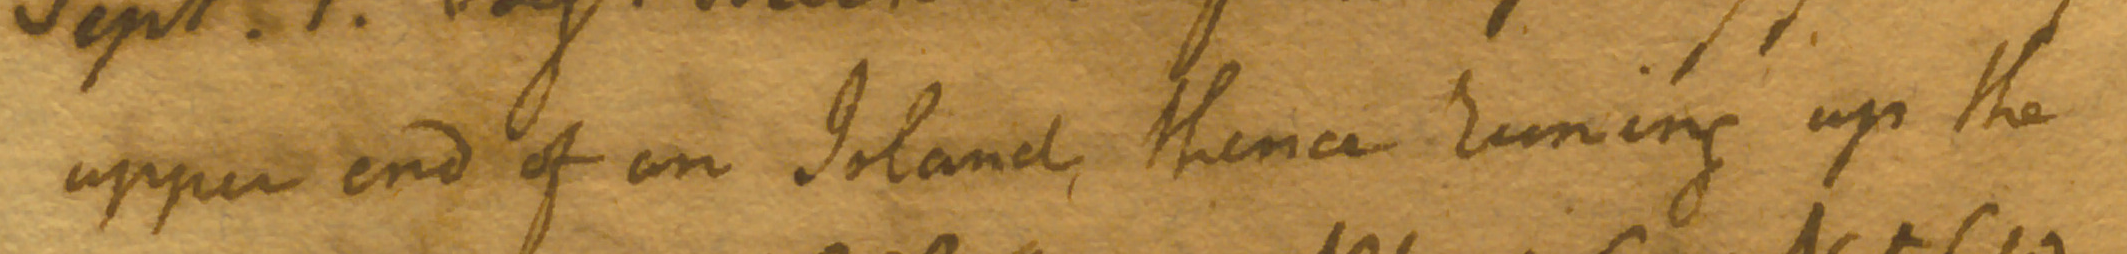upper end of an Island, thence running up the
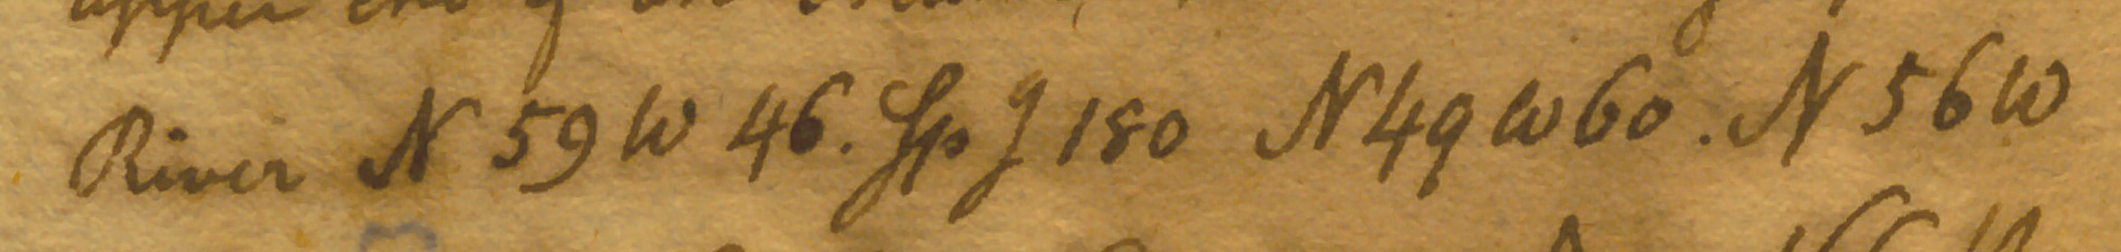River N 59W 46. Spg 180 N49W60. N56W
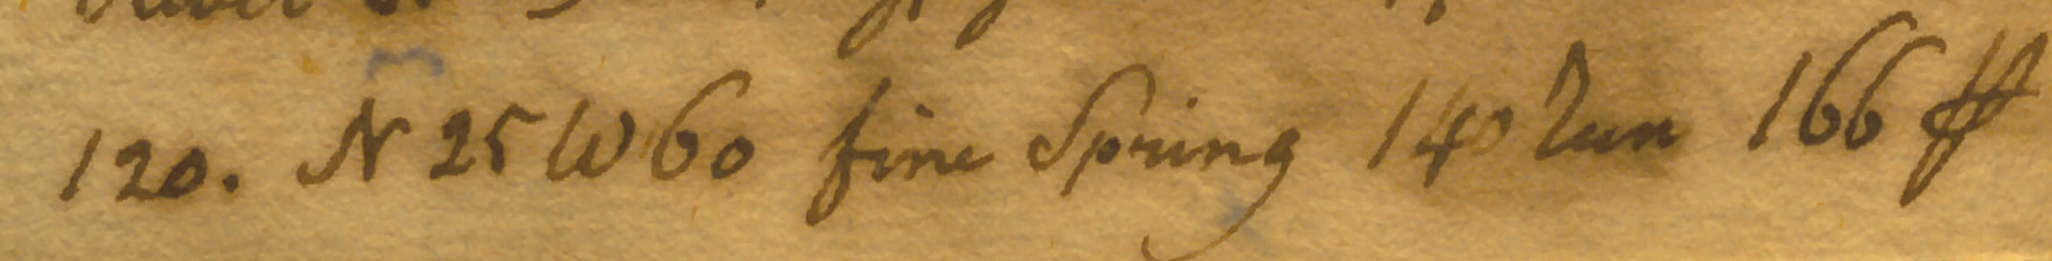120 N25W60 fine Spring 140 run 166 per
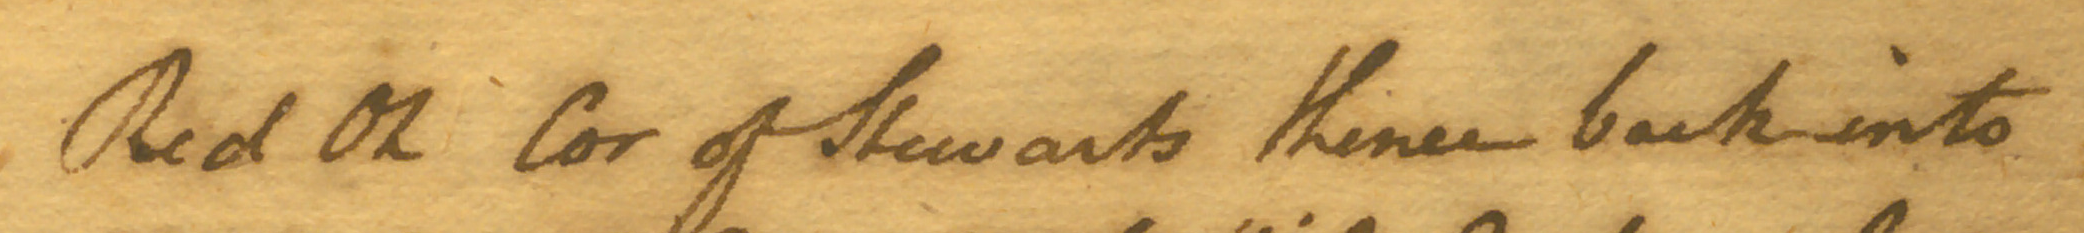Red 0h Cor of Stewarts thence back into
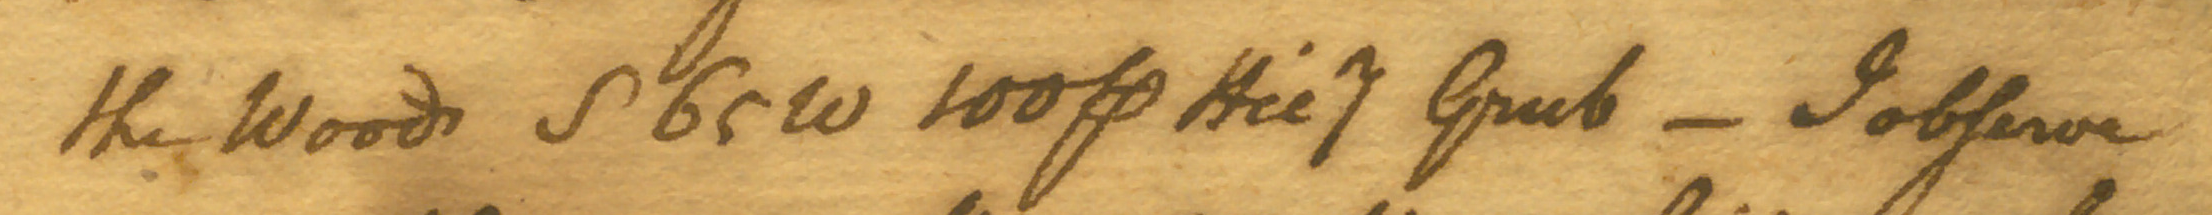the Woods S 65W 100 per Acc 7 Grub- I observe
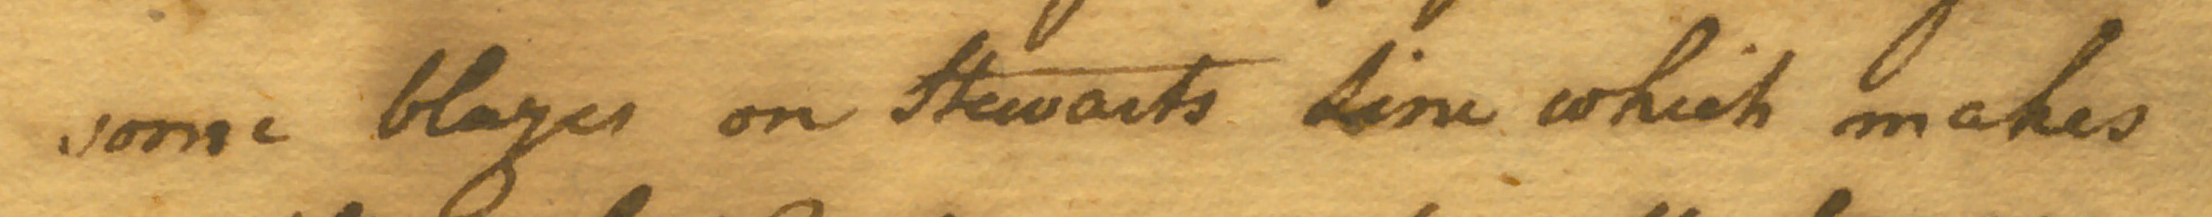some blazes on Stewarts Line which makes
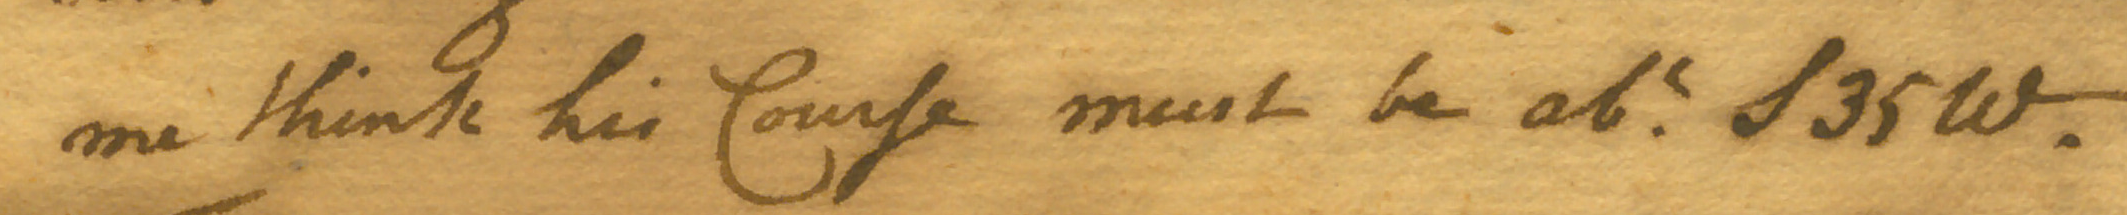me think his Course must be ab^t. S 35W.
